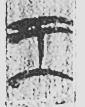王
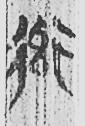率
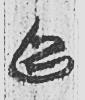𠂤
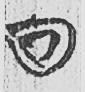回
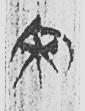宋
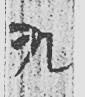九
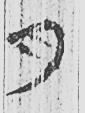月
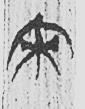宋
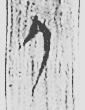人
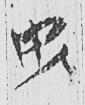𡚦
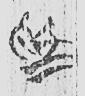爲
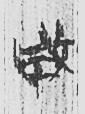成
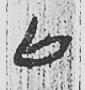㠯（以）
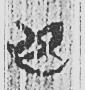女
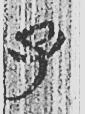子
